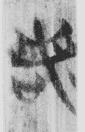若
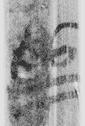爲
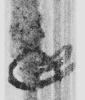臣
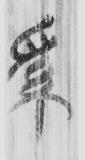奚
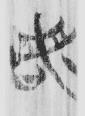若
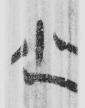少
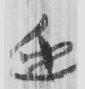臣
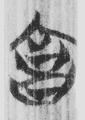合
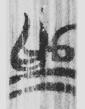爲
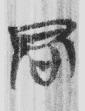君
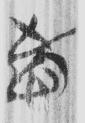㤅
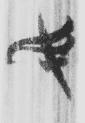民
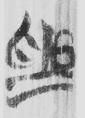爲
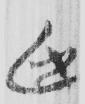臣
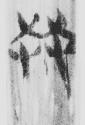共
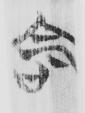命
